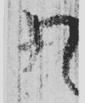卜
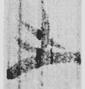之
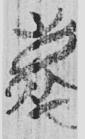○（表）
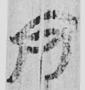尹
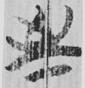至（致）
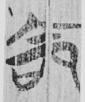命
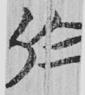於
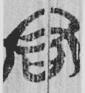君
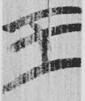王
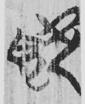既
